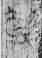執
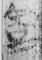命
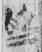爲
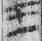王
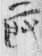取
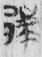邾
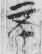不
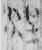浧
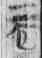而
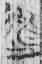逃
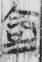命
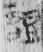○（屬）
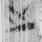之
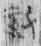政
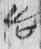左
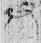尹
